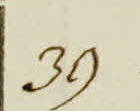39
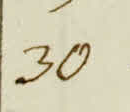30
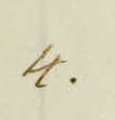4.
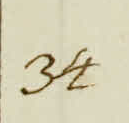34
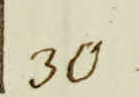30
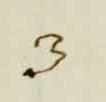3
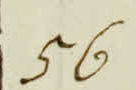56
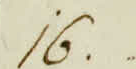16
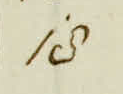18
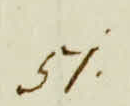51.
